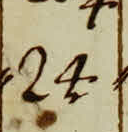24
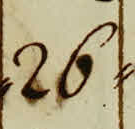26
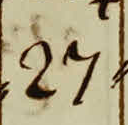27
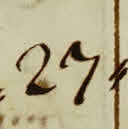27
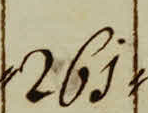261
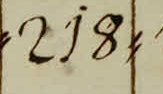218
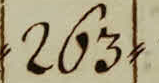263
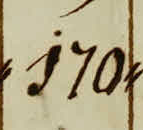170
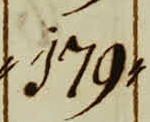179
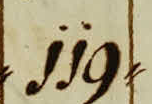119
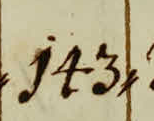143
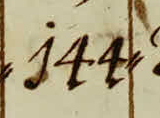144
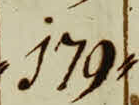179
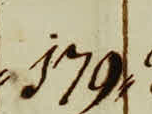179
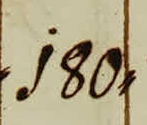180
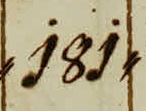181
